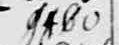9460
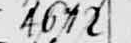4672
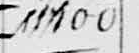11700
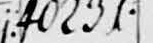40231
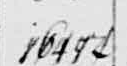16472
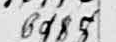6985
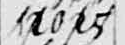12025
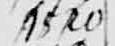9520
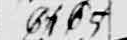6465
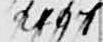2497
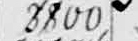3800
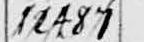12487
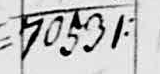70531
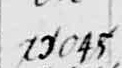13045
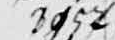3952
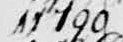11790
